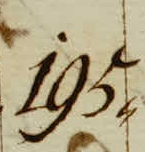195
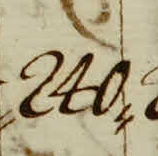240
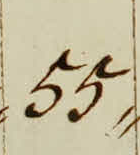55
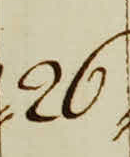26
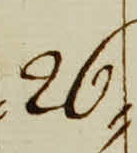26
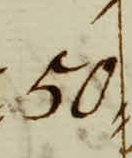50
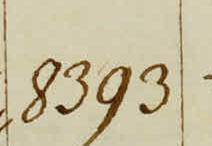8393
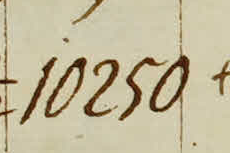10250
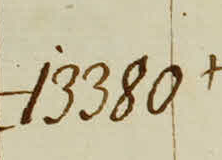13380
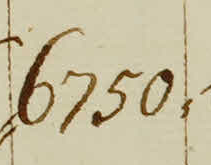6750
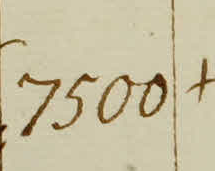7500
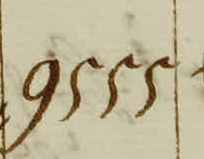9555
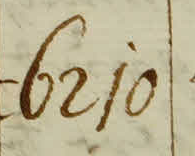6210
